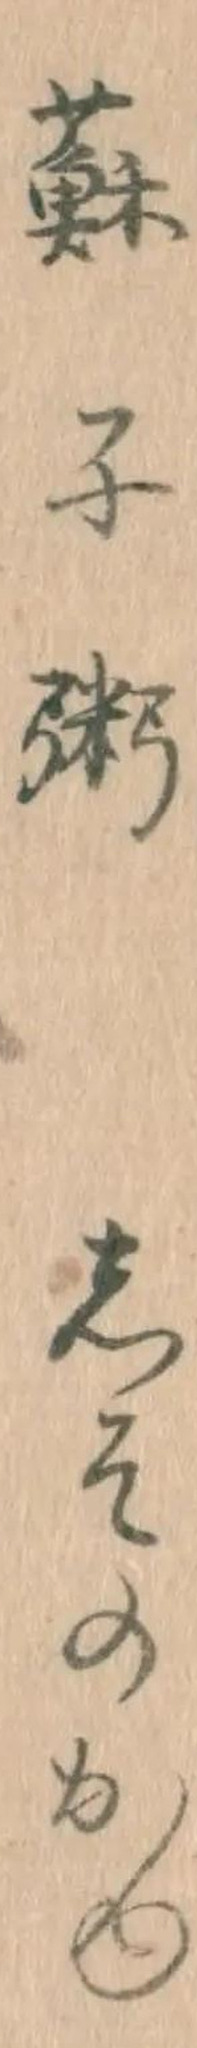蘇子粥しそのかゆ
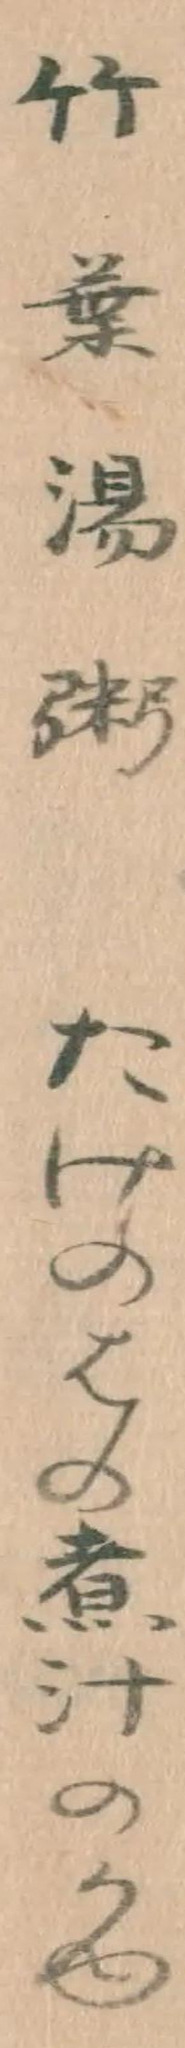竹葉湯粥たけのこの煮汁のかゆ
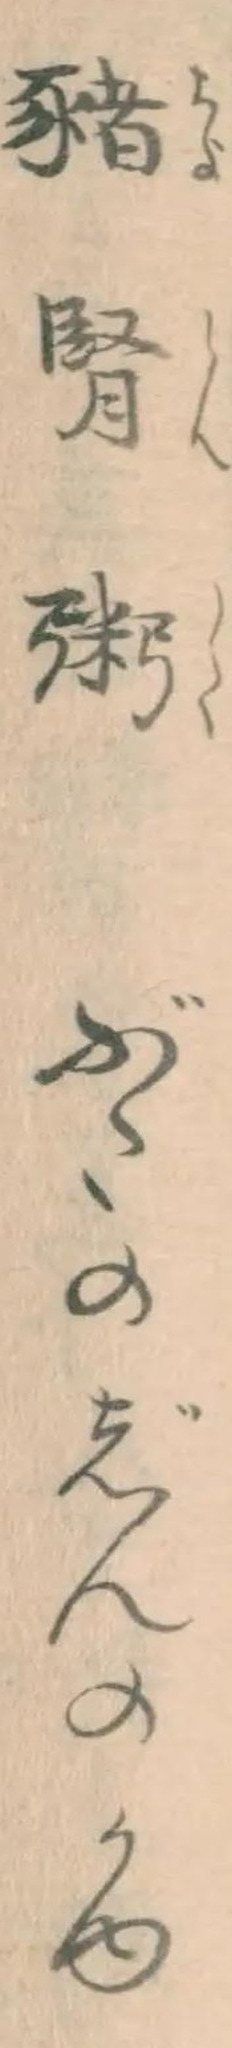猪腎粥ぶたのじんのかゆ
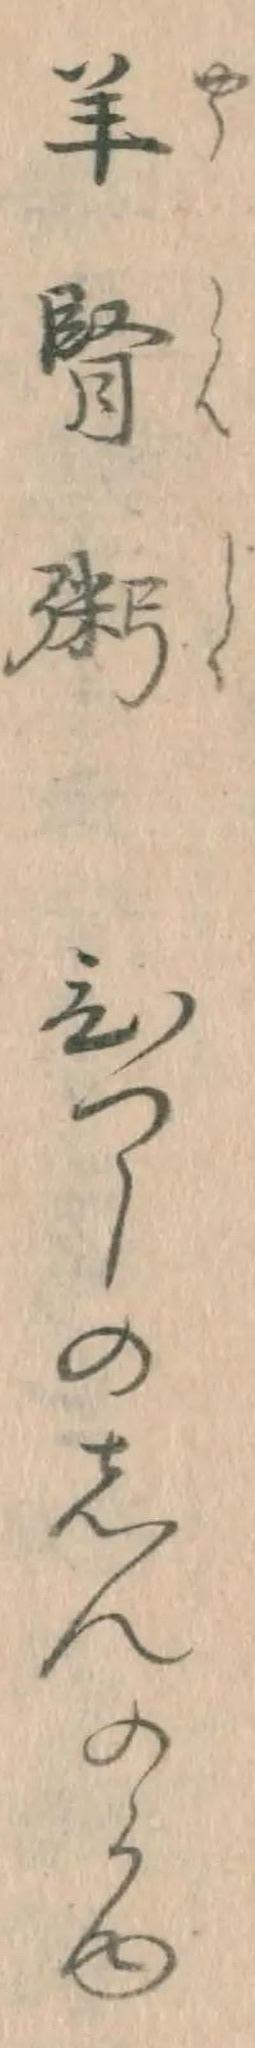羊腎粥ひつしのしんのかゆ
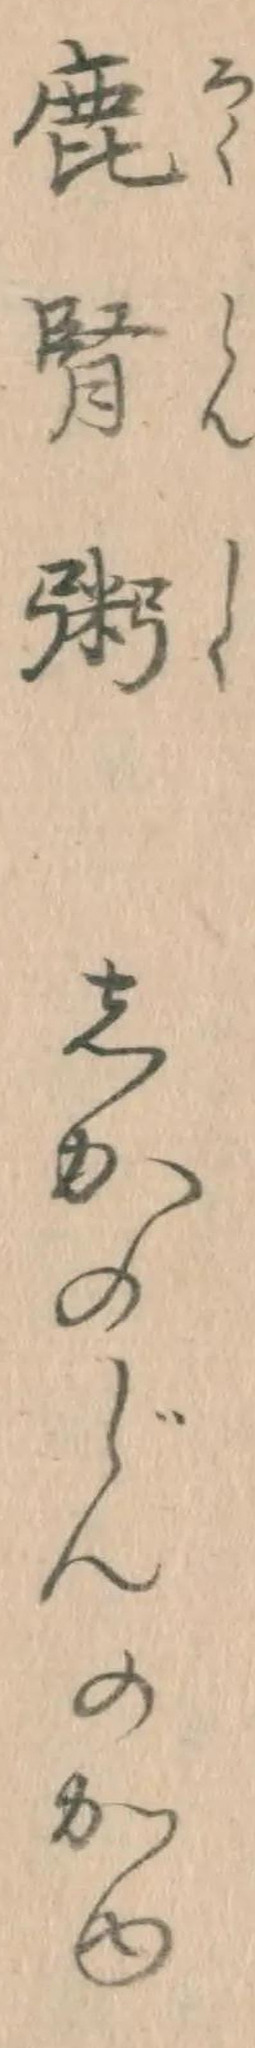鹿腎粥しかのじんのかゆ
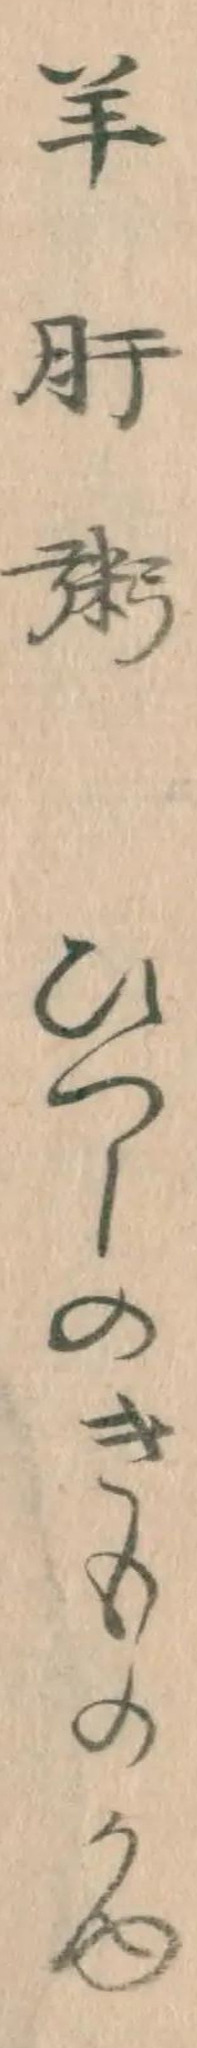羊肝粥ひつしのきものかゆ
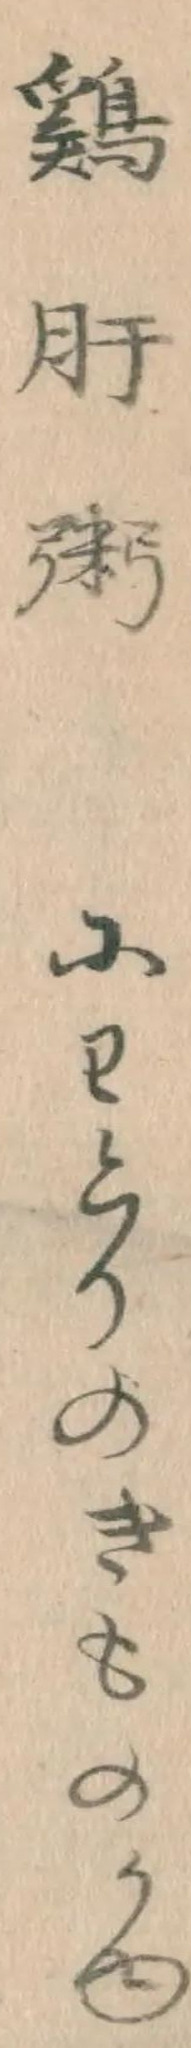鶏肝粥にわとりのきものかゆ
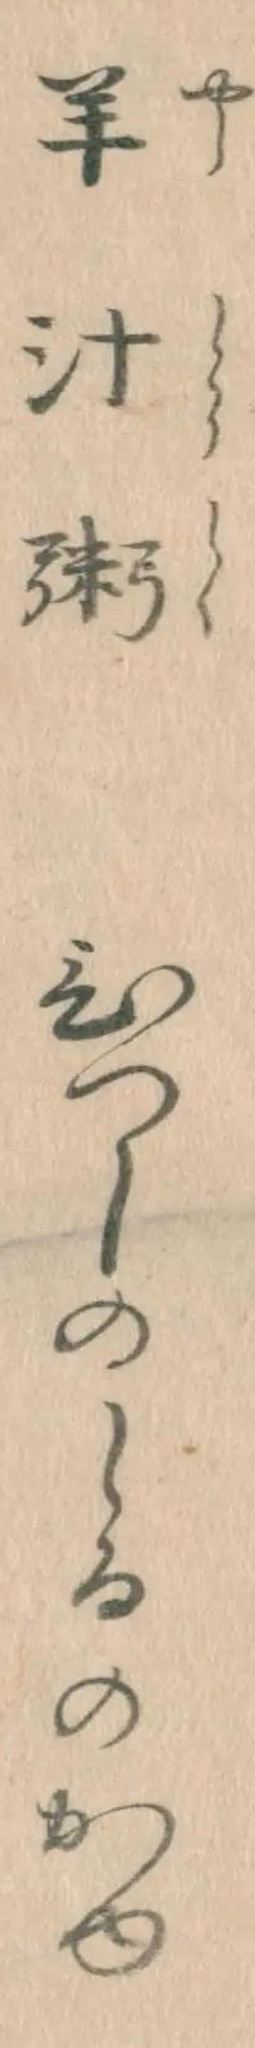羊汁粥ひつしのしるのかゆ
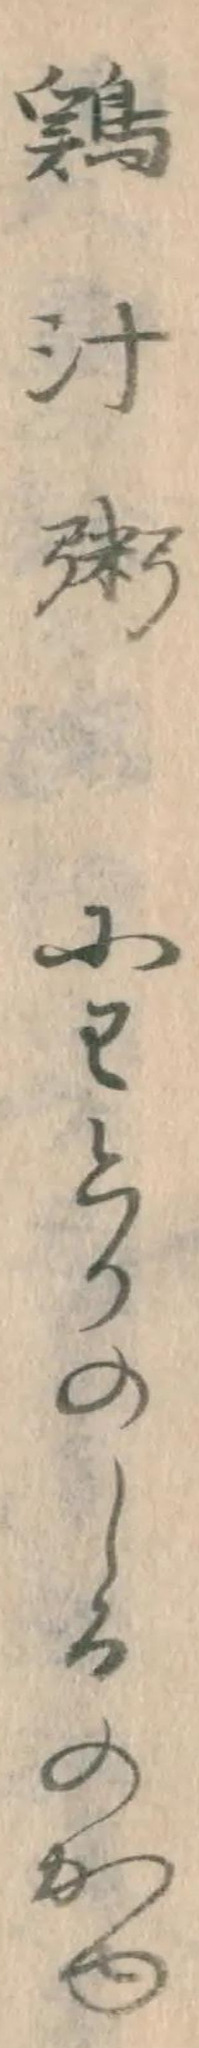鶏汁粥にわとりのしるのかゆ
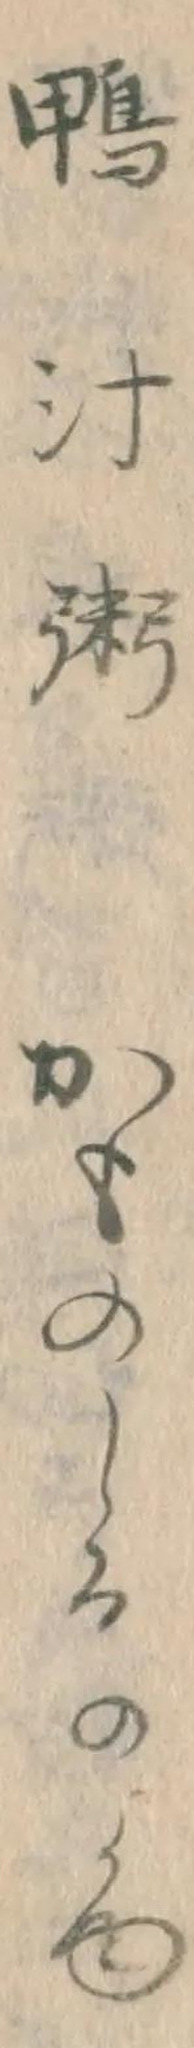鴨汁粥かものしるのかゆ
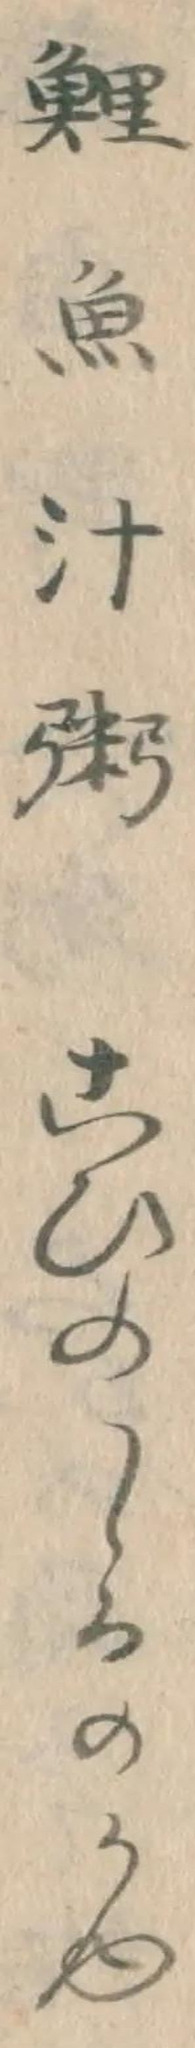鯉魚汁粥こひのしるのかゆ
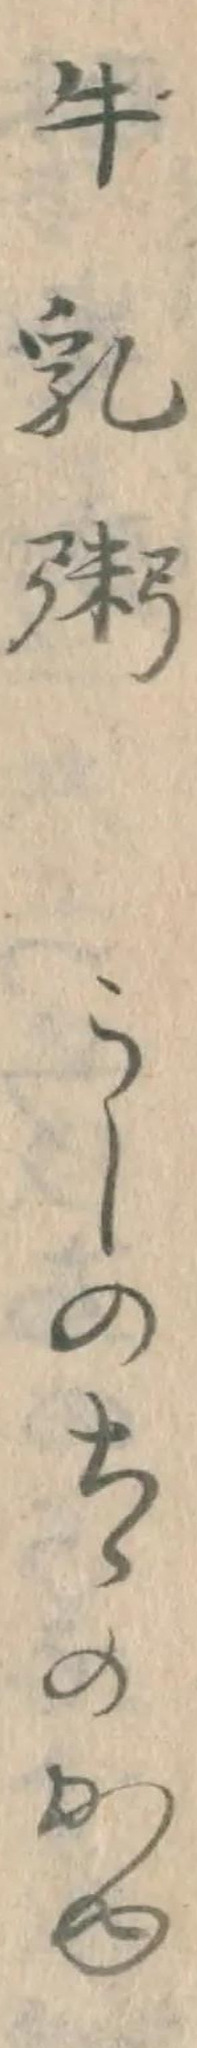牛乳粥うしのちゝのかゆ

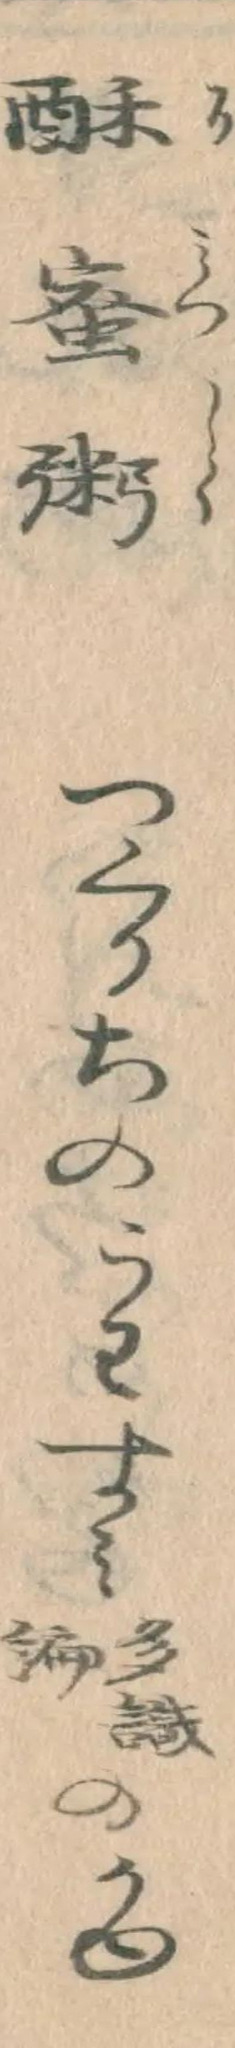酥蜜粥つくりちのうわすみ多識編のかゆ
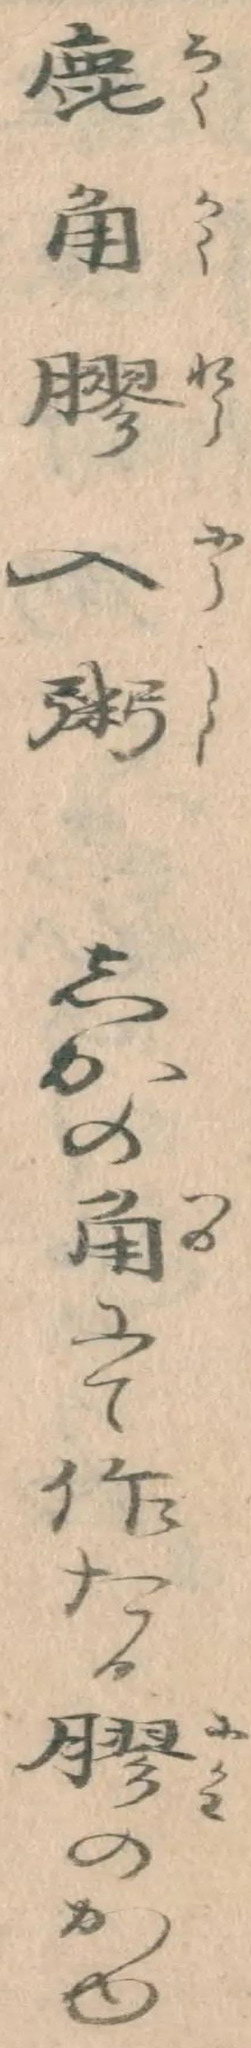鹿角膠入粥しかの角にて作たる膠のかゆ
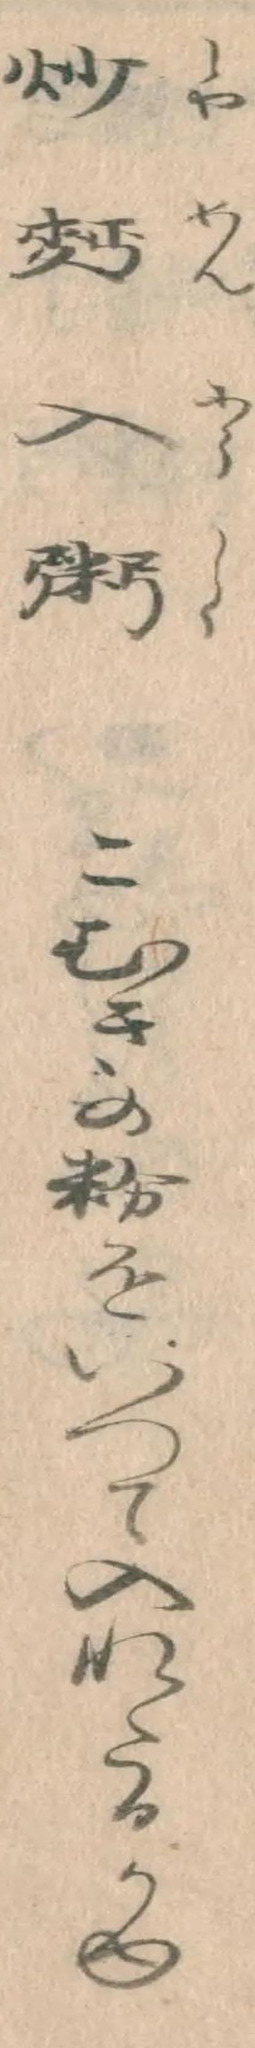炒麺入粥こむきの粉をいつて入れたるかゆ
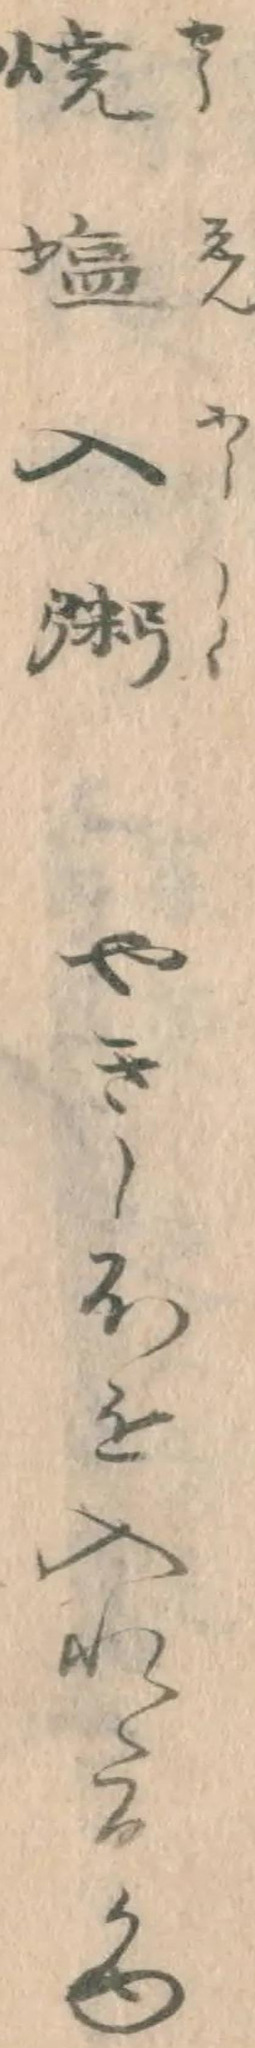焼塩入粥やきしほを入れたるかゆ
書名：本草図譜. 巻43-45
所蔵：国立国会図書館 National Diet Library, JAPAN
